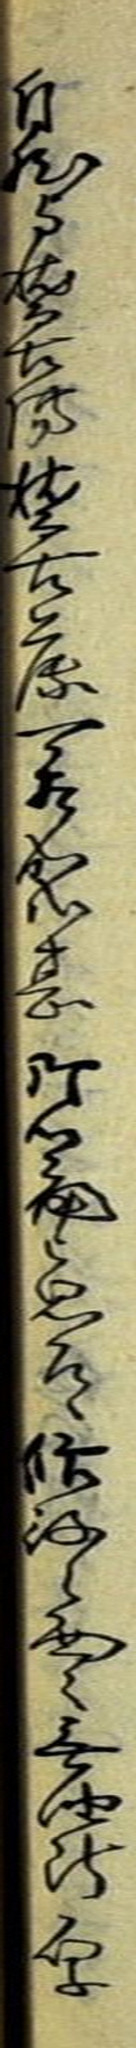自然与稽古場稽古薄可相成哉甚御心痛被思召候師役之面々無油断厚
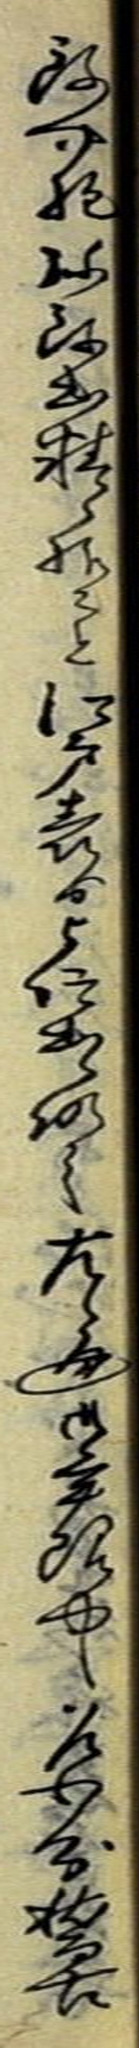致介抱弥致出精候様ニと江戸表ゟ被仰出候仍之左之通御年限中乍少分稽古

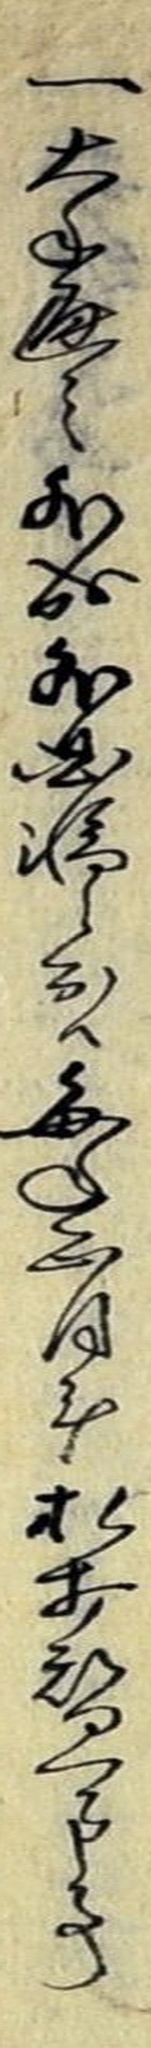一大手通之外成外曲輪之分ハ毎年正月斗札打替可申事
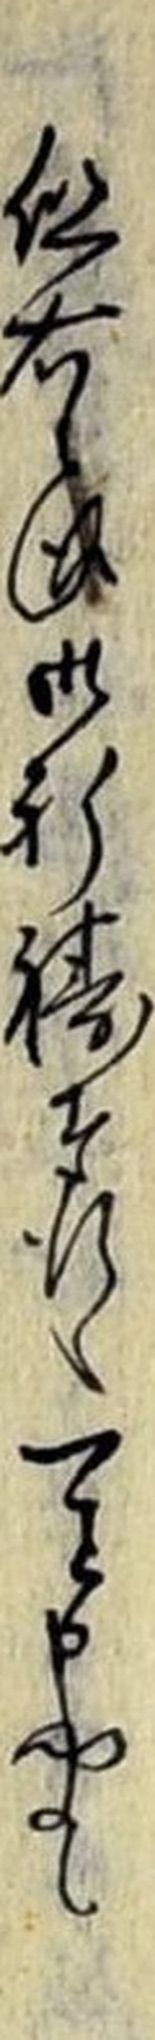但右之趣御祈祷奉行へ可被申聞候
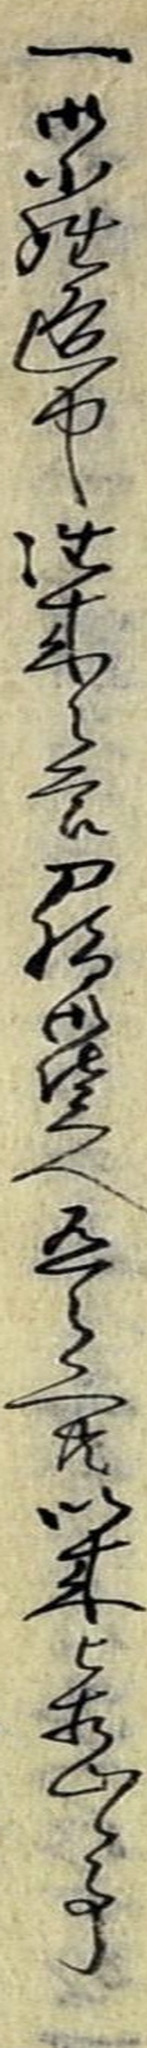一御小姓道中往来之節刀指御貸人有之候へ共以来被相止候事
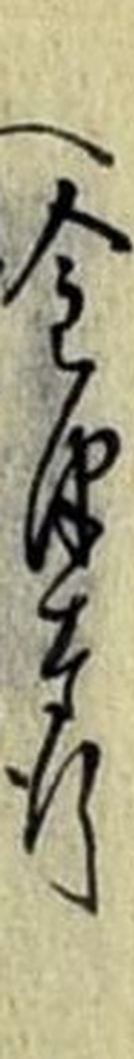金津奉行
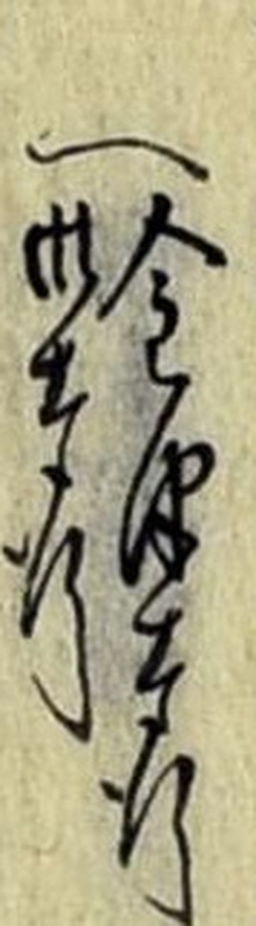御奉行
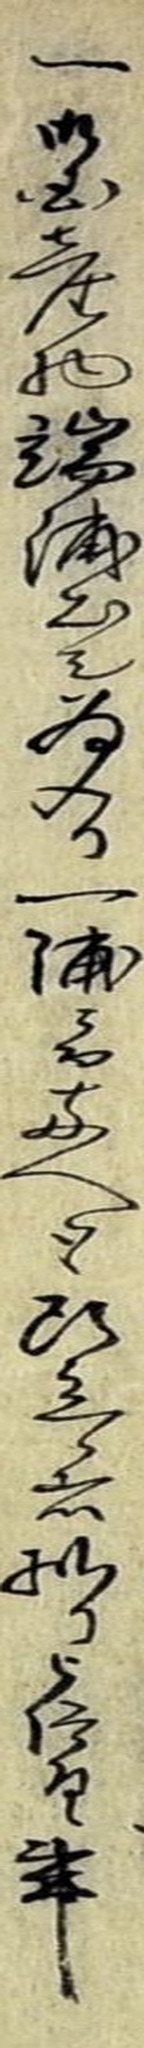一御国産物端浦出シ為〆り一浦ニ而両人ツヽ頭立候者掛り被仰付候事
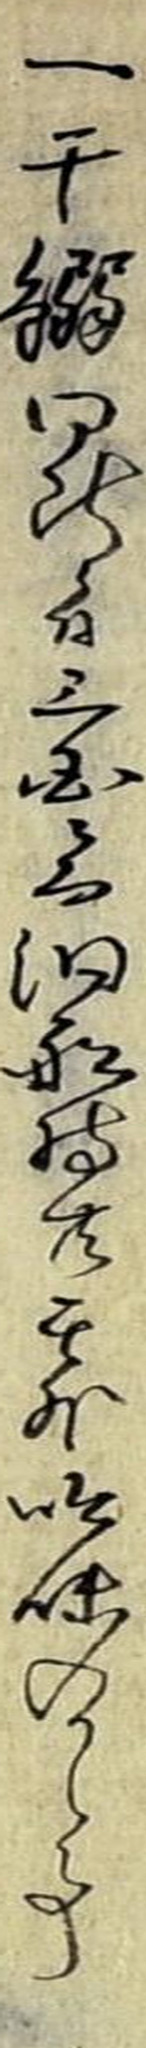一干鰯同断ニ付三国ニ而船持共其外吟味〆り候事
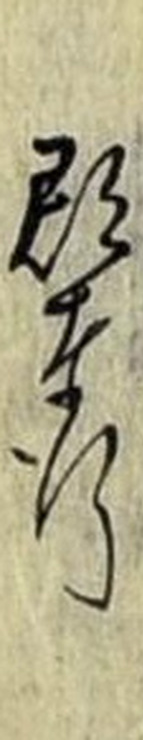郡奉行
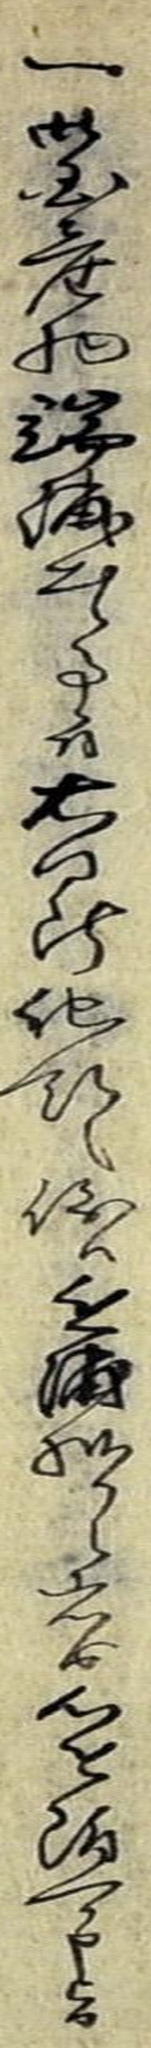一御国産物端浦出之事ニ付右同断他領之儀ハ近浦掛り之者ゟ心を付可申旨
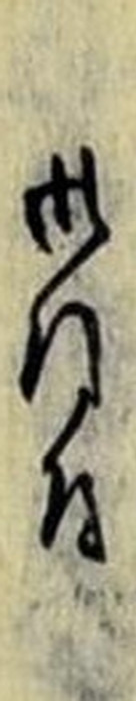御目付
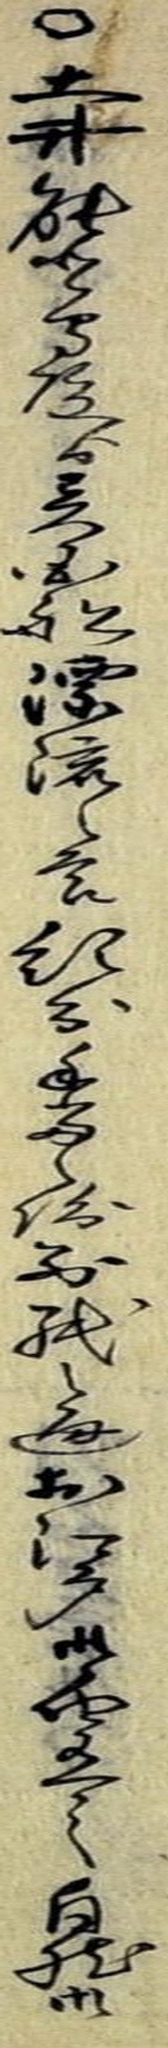〇土井能登守殿ゟ異国船漂流之節領分手当之儀別紙之通於江戸御届有之自然御
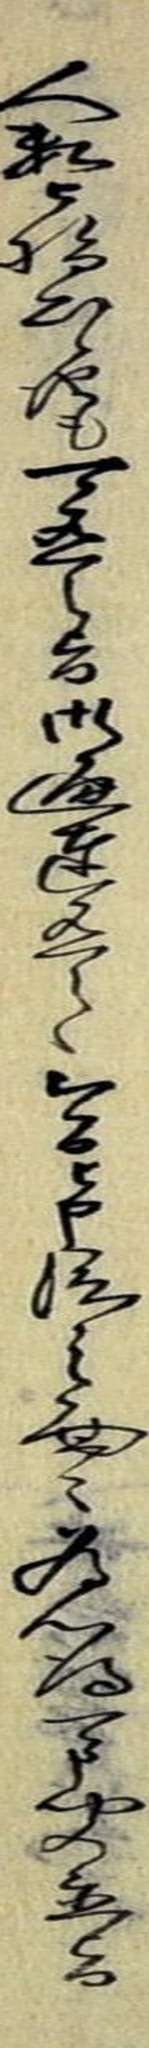人数被指出候儀も可有之旨御通達有之候今日被申渡之面々為心得可申聞置旨
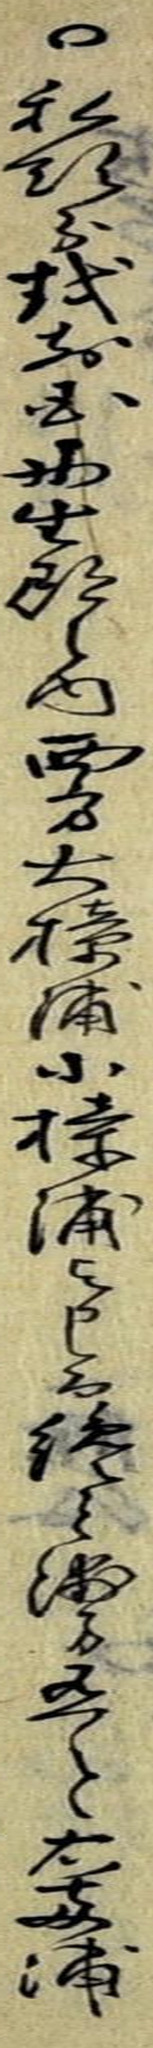〇私領分越前国丹生郡之内西方大樟浦小樟浦与申候而纔之浦方有之候右両浦
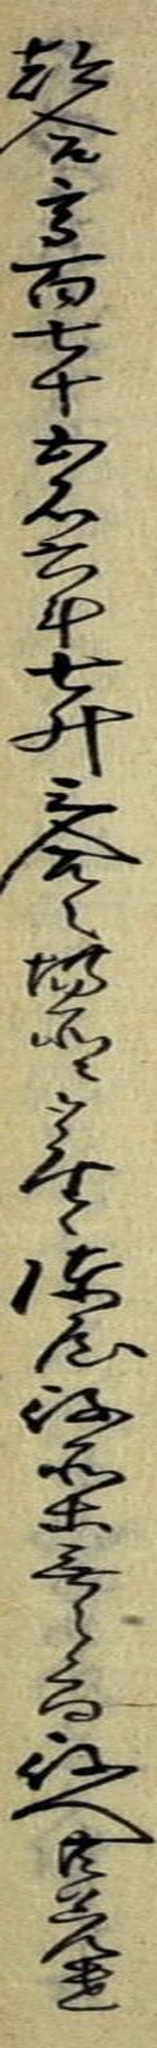都合高百七十五石六斗七升三合之場所ニ御座候陣屋役所等無之候間役人共差遣
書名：命令之部 三
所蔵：福井県文書館 Fukui Prefectural Archives
